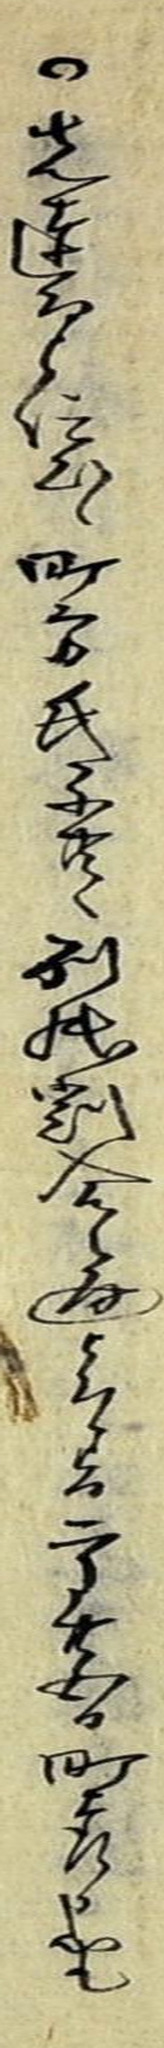○先達而被仰出候町方氏子共へ別紙割合之通被下候旨二月廿五日町奉行申聞候
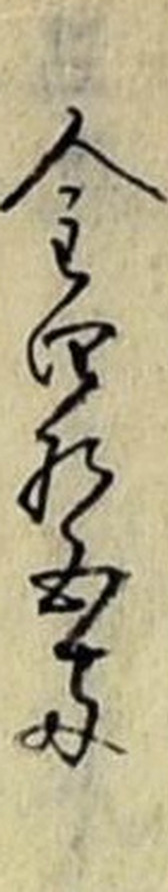金四拾五両
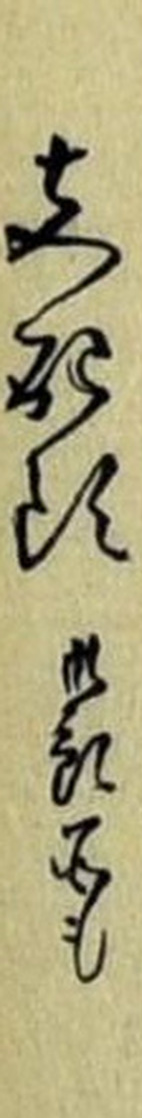支配頭御預所も
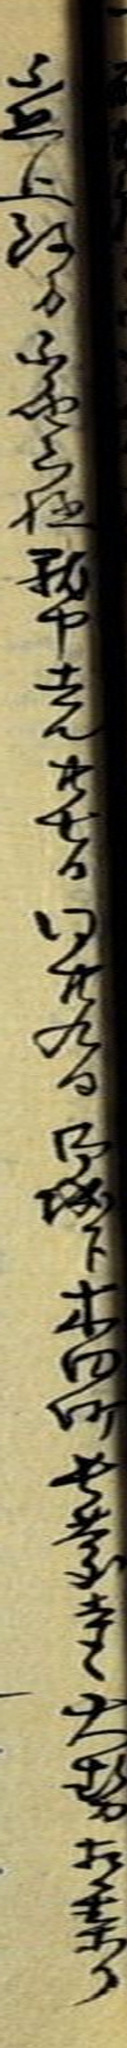不恐上致方不届至極就中去ル廿七日同廿九日御城下木田町長慶寺へ大勢相集り
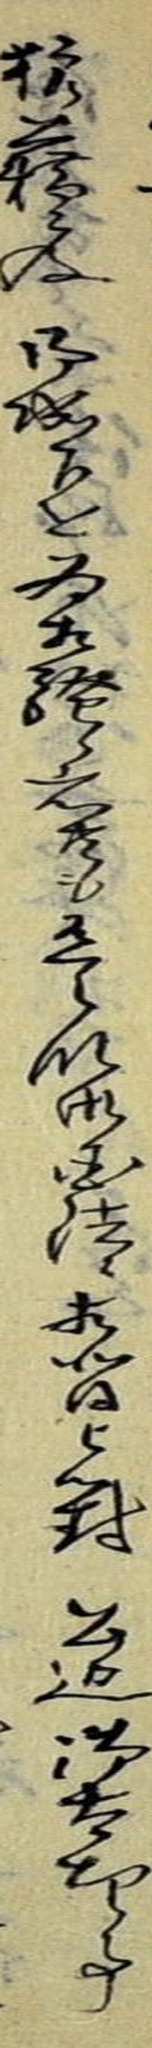狼藉に及御城下を為相騒候者共も有之段御国法に相背者対公辺御太切之事
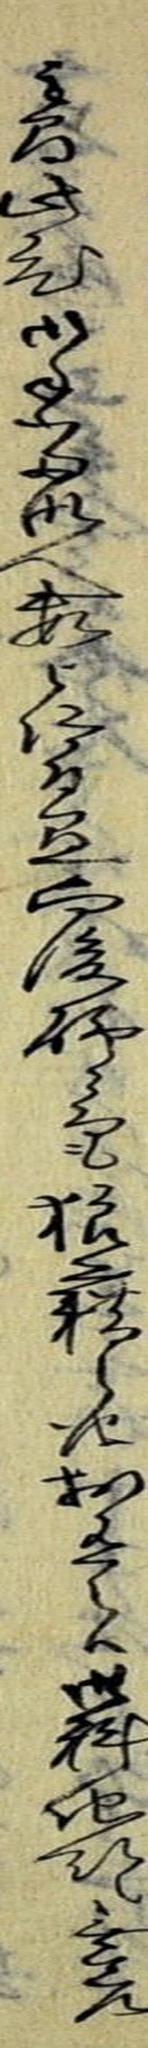に候間此度御手当御人数被仰付置向後聊に而も狼藉之儀於有之は御料他領無差
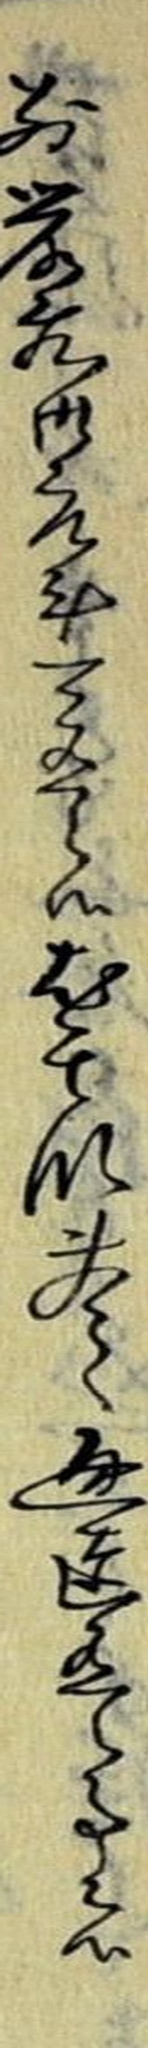別厳敷御取斗可有之候尤其段夫々へ通達有之事に候
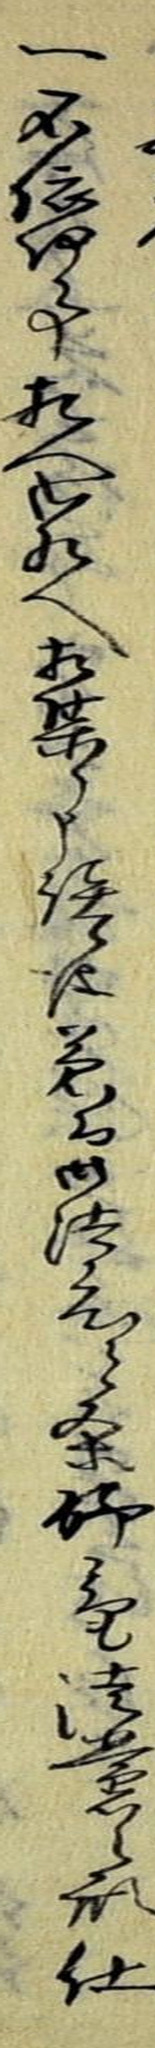一不依何事拾人弐拾人相集り申談候儀兼而御法度に候条聊に而も徒党之形仕
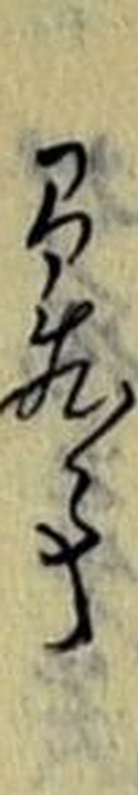間敷事
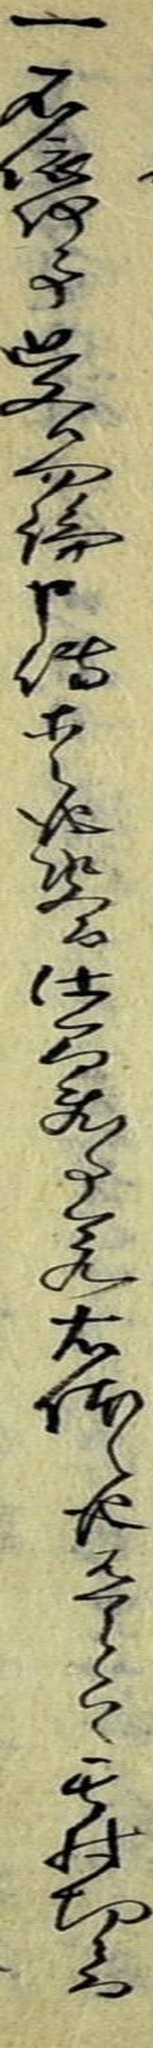一不依何事廻文は勿論申伝等之儀決而仕間敷事若右体之儀有之候はヽ其村切に而
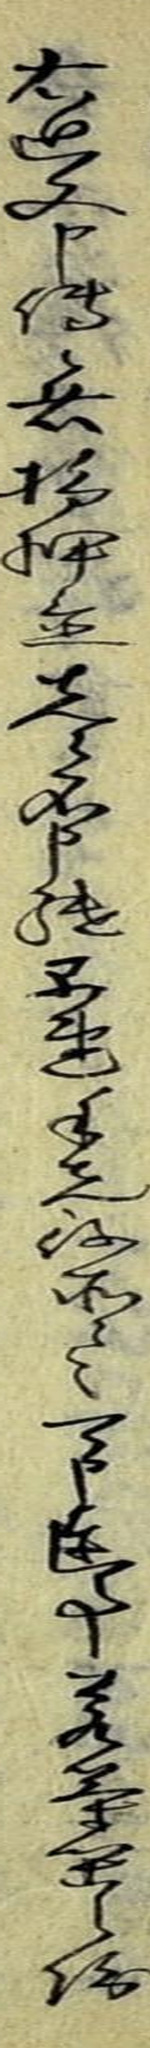右廻文申伝候者指押置先に不申継早速手元役所にて可申達事若等閑之儀
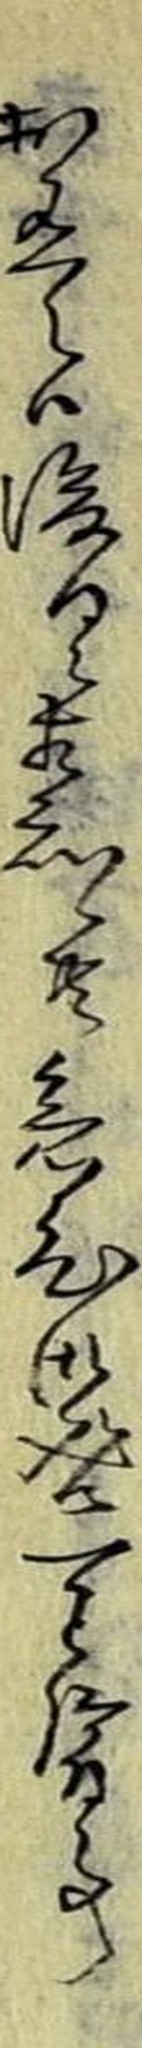於有之は後日に相知候共急度御咎可被仰付事
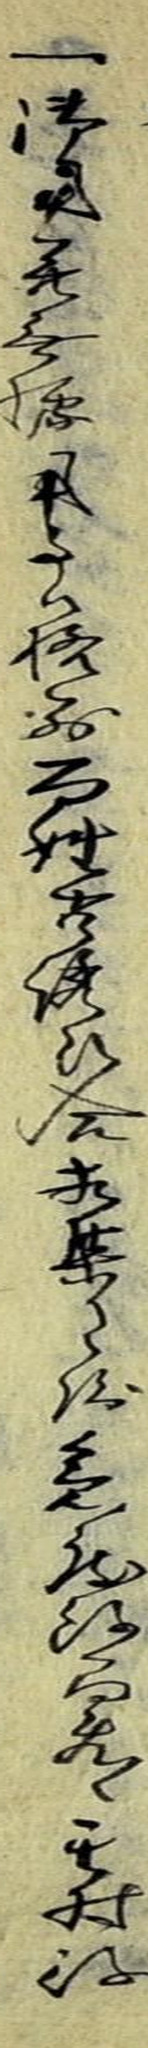一御用并無拠用事は格別百姓共誘行合相集り候儀急度致間敷候其村役
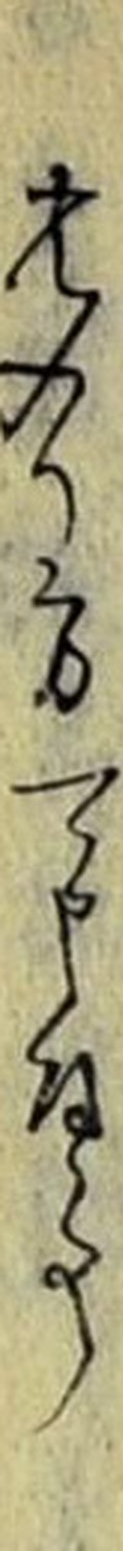共〆り方可申付事
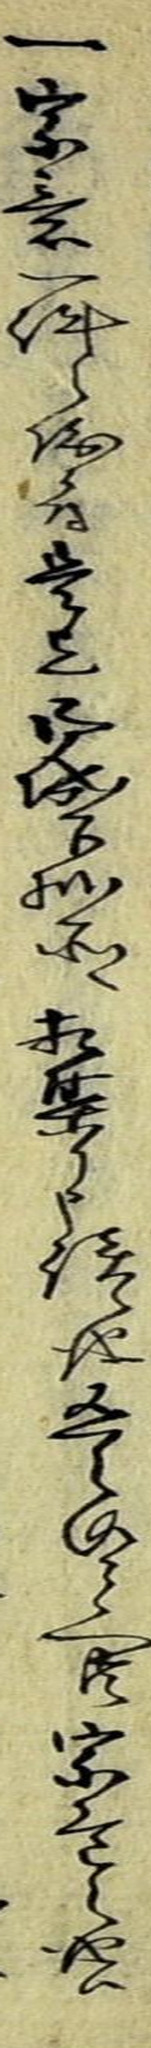一宗意一件之儀に付是迄御城下掛所へ相集り申談候儀有之趣に候へ共宗意之儀は
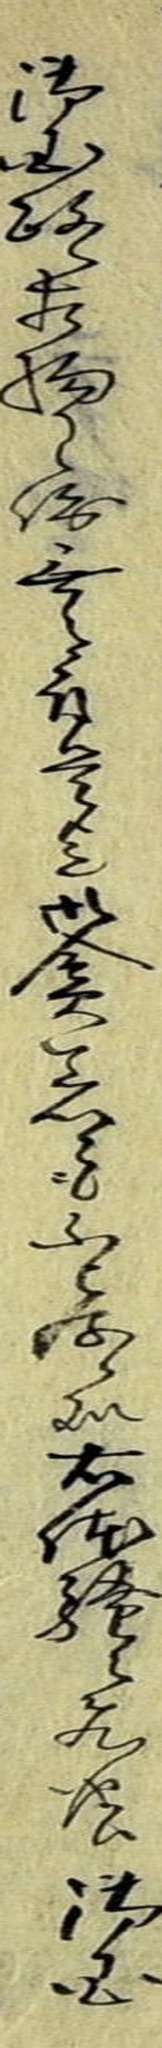御国政へ相拘之儀無之候に付是迄御貧着にも不被致候処右体騒敷儀は御国
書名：命令之部 四
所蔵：福井県文書館 Fukui Prefectural Archives
